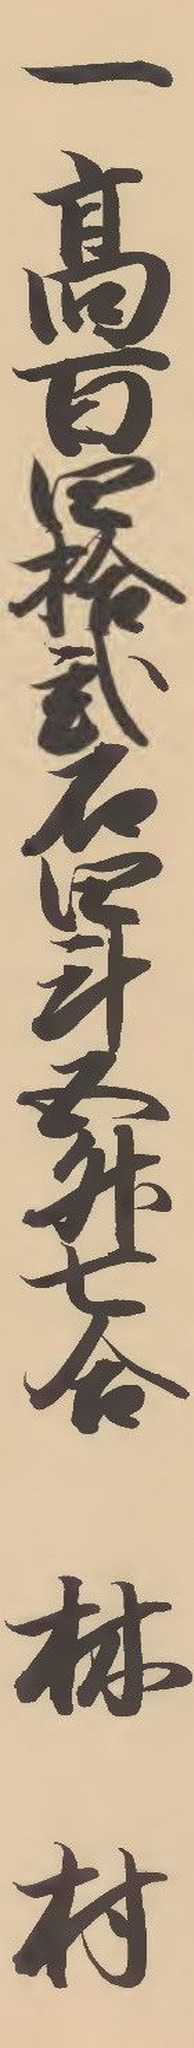一高百四拾弐石四斗五升七合林村
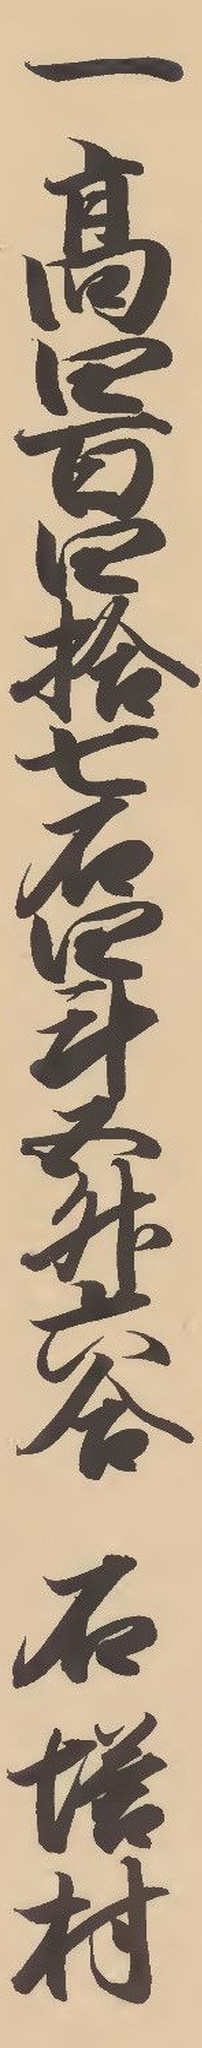一高四百四拾七石四斗五升六合石塔村
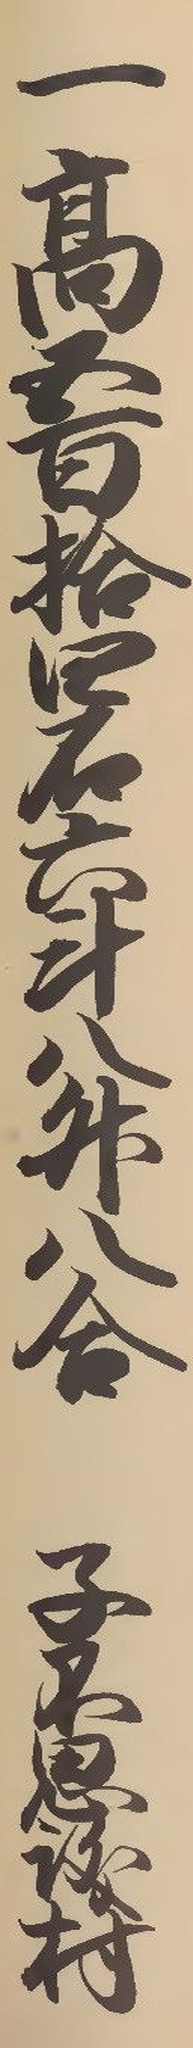一高五百拾四石六斗八升八合子不思議村
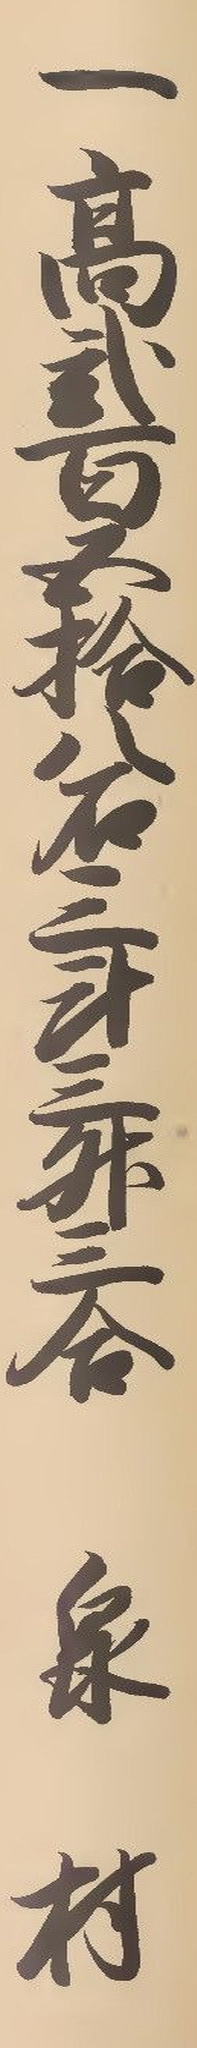一高弐百五拾八石三斗三升三合泉村
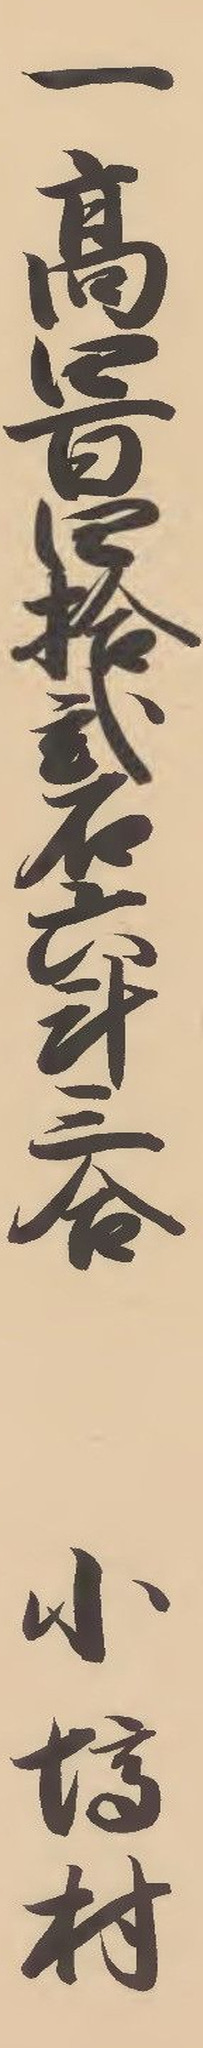一高四百四拾弐石六斗三合小塙村
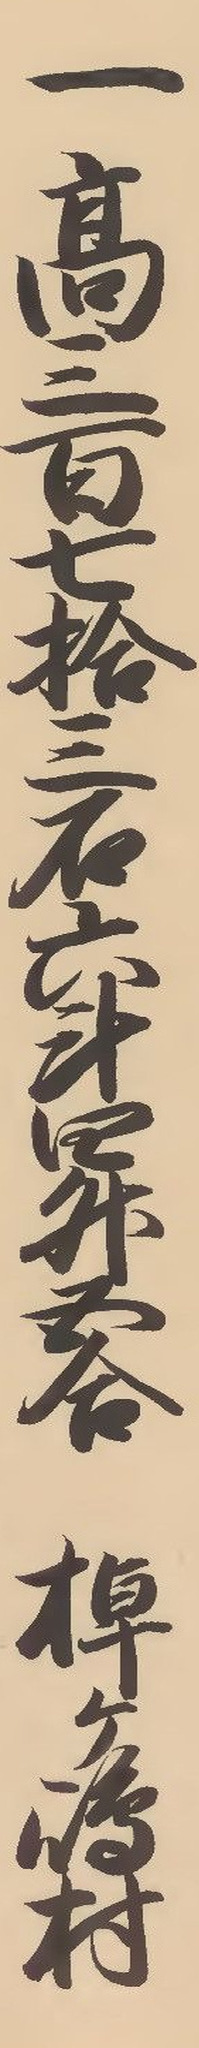一高三百七拾三石六斗四升五合棹ヶ島村
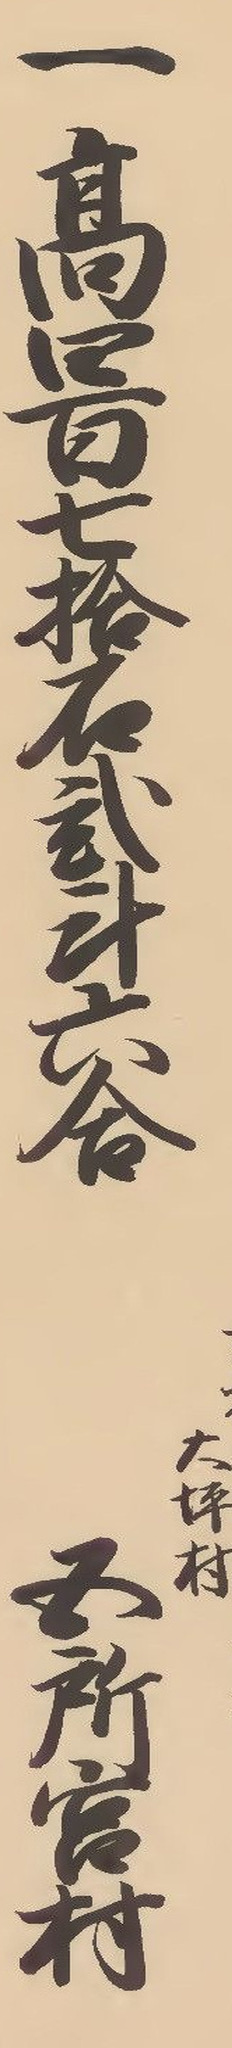一高四百七拾石弐斗六合五所宮村

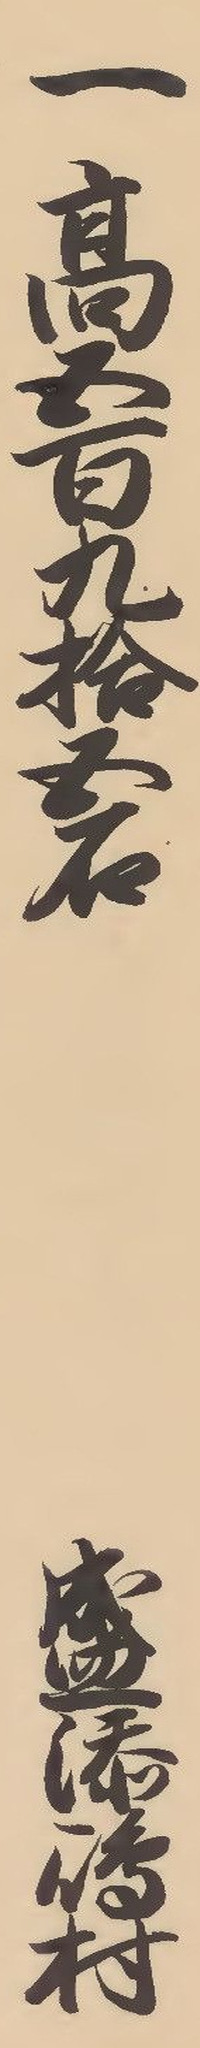一高五百九拾五石盛添島村
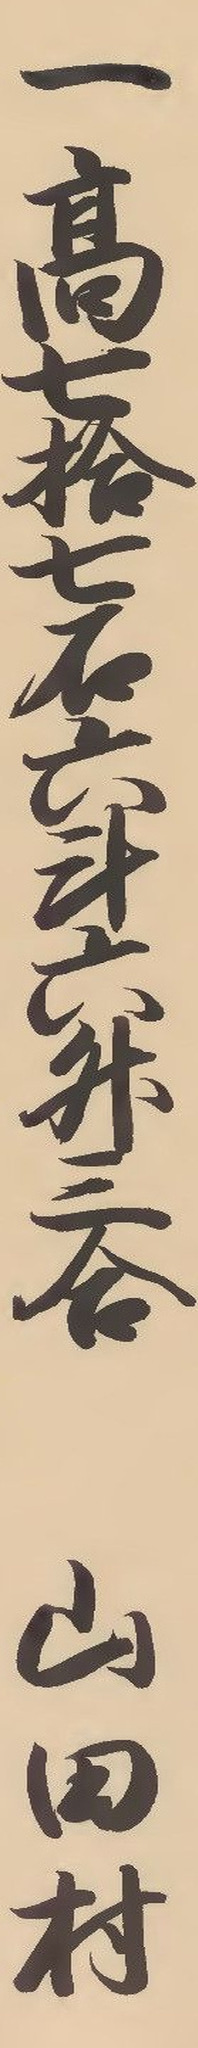一高七拾七石六斗六升三合山田村
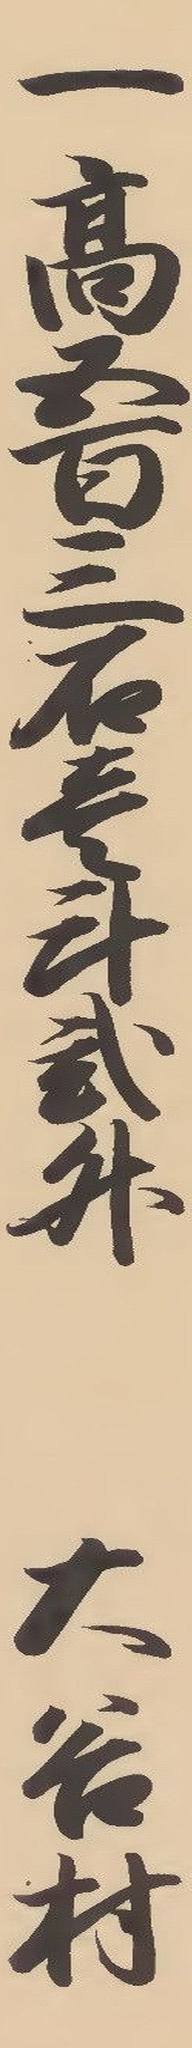一高五百三石壱斗弐升大谷村
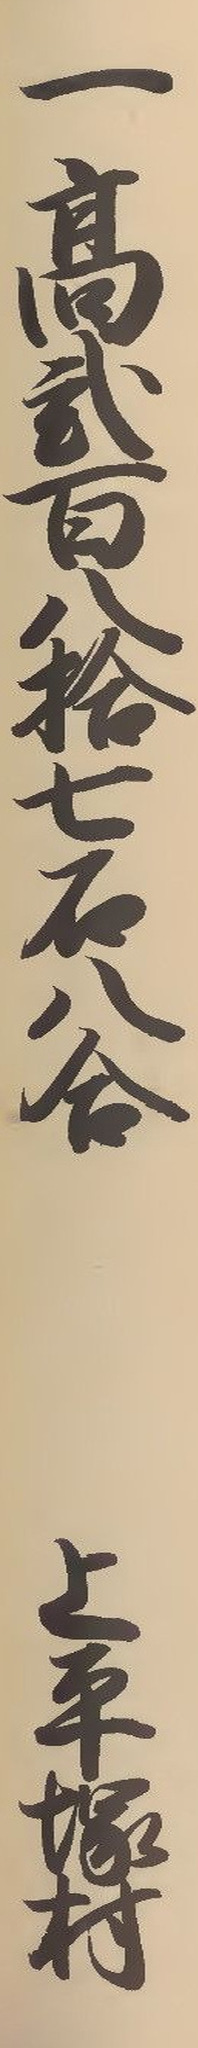一高弐百八拾七石八合上平塚村
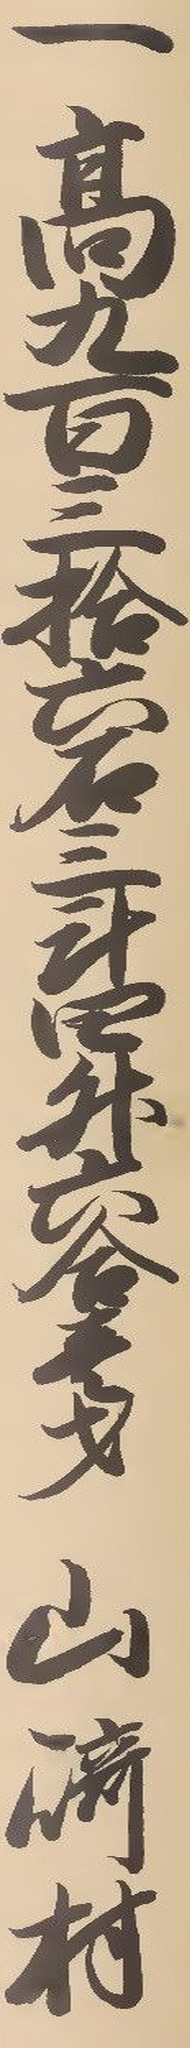一高九百三拾六石三斗四升六合壱才山崎村
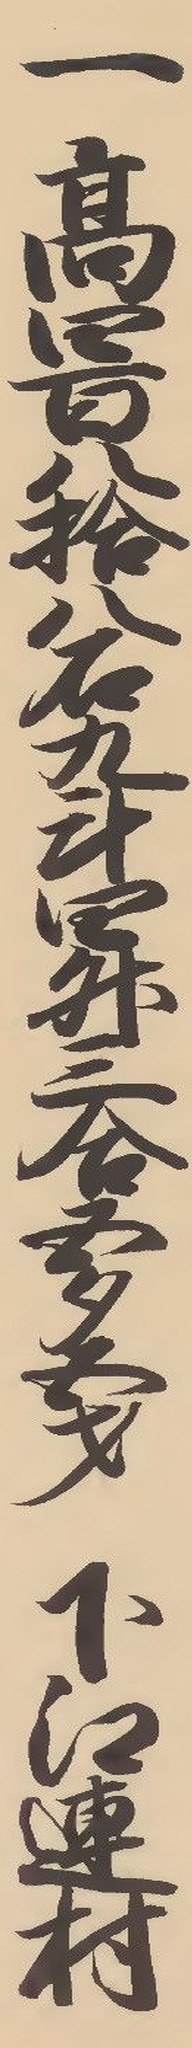一高四百八拾八石九斗四升三合五勺五才下江連村
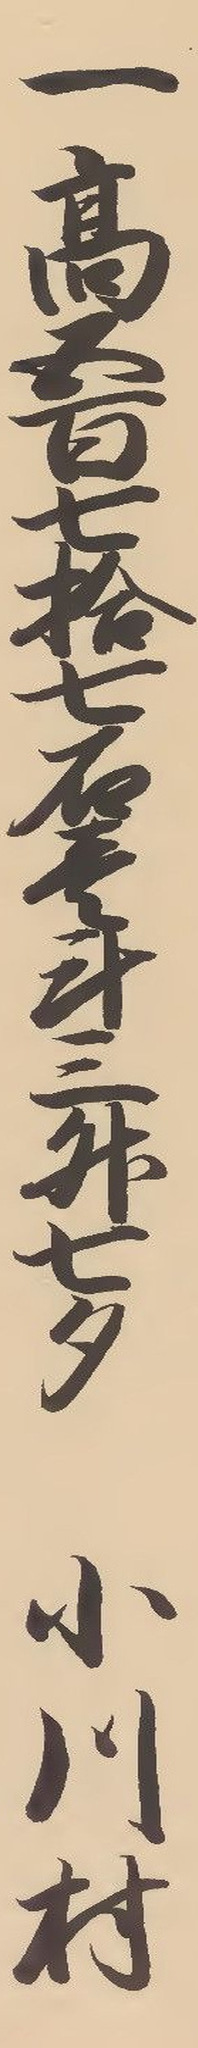一高五百七拾七石壱斗三升七勺小川村
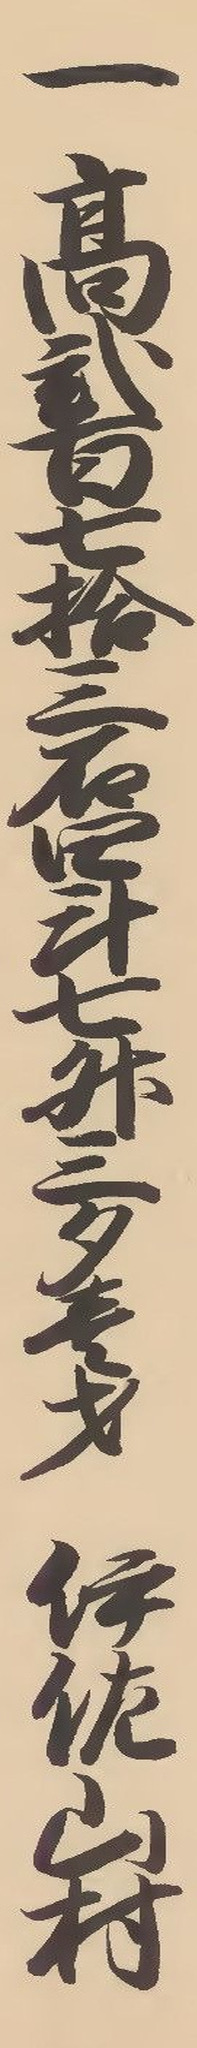一高弐百七拾三石四斗七升三勺壱才伊佐山村

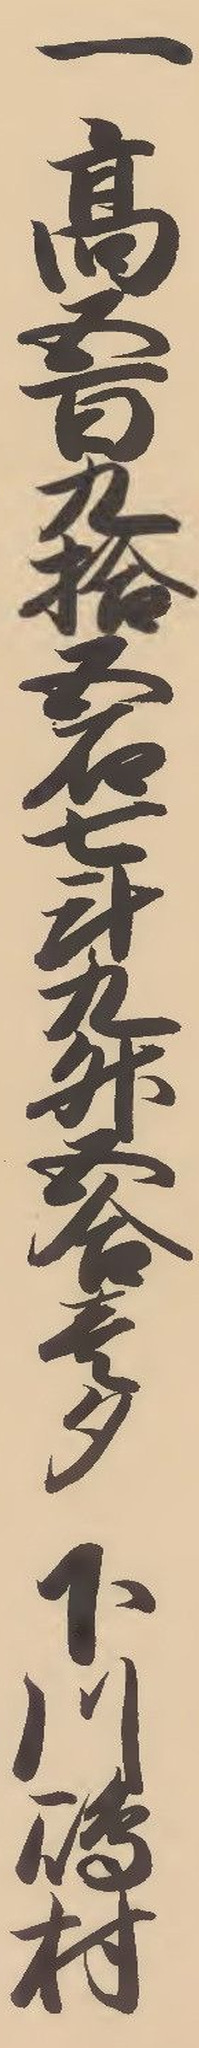一高五百九拾五石七斗九升五合壱勺下川島村
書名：常陸国郷帳
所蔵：国立公文書館 National Archives of Japan
